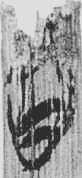皆
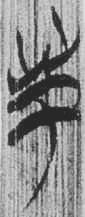芋
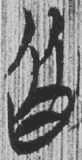皆
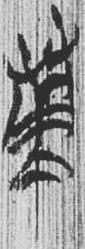英
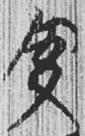交交
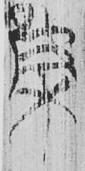集
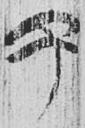于
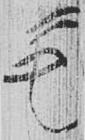𠁩
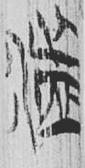渚
